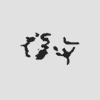敗
